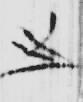之
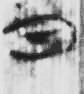日
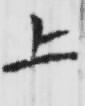上
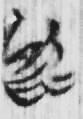臨
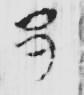邑
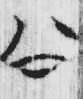公
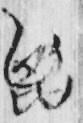臨
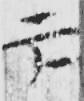下
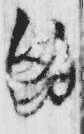臨
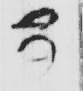邑
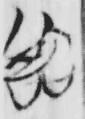臨
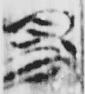○（得）
